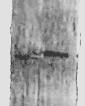一
